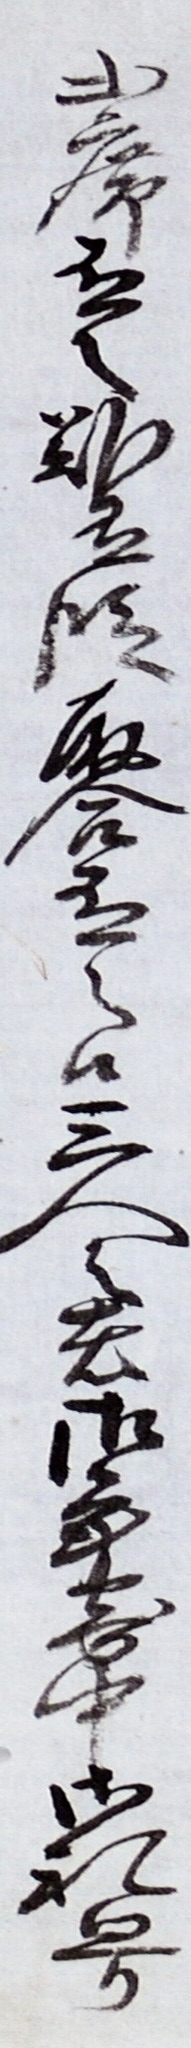出席有之難有段取合有之候三人之者御年寄中御礼廻り
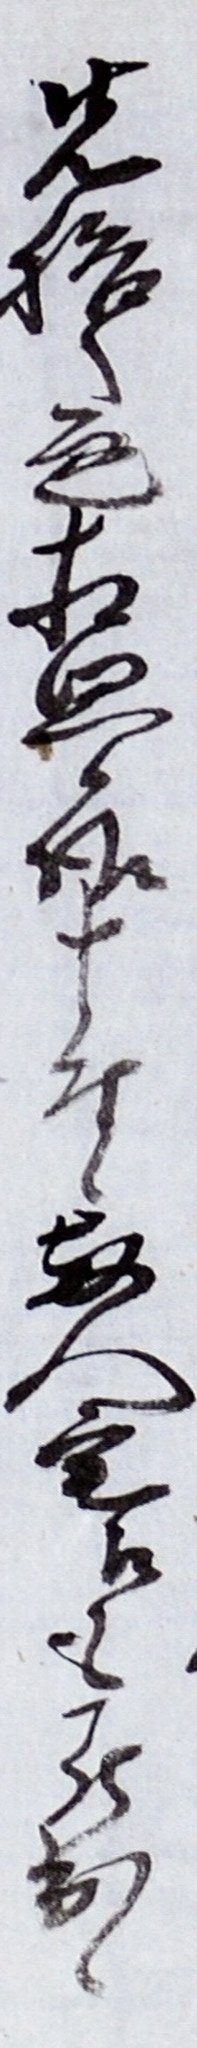先格之通相廻候様申付候両人宅江も罷出候
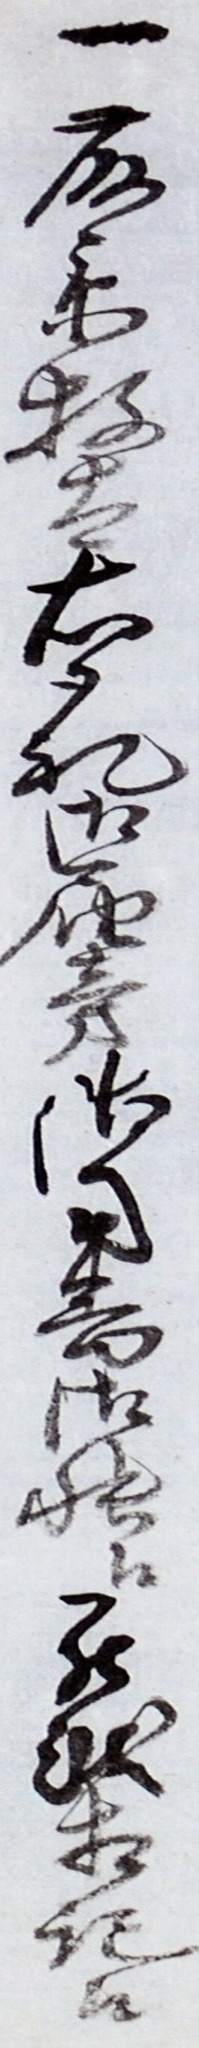一藤京牧太右御札御届旁御用番御帳江罷越相記候
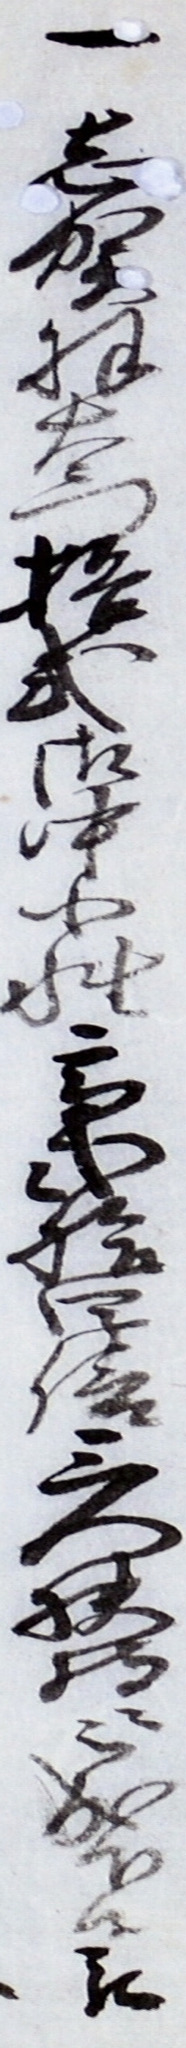一志賀羽右衛門格式御中小姓高弐拾四俵三人扶持ニ而成下候被
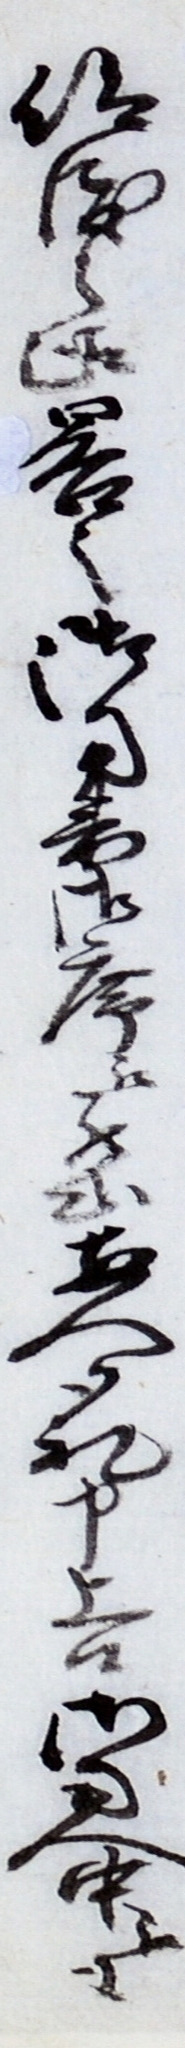仰渡候趣略之御用番御席江罷出両人御礼申上候御用人中江も
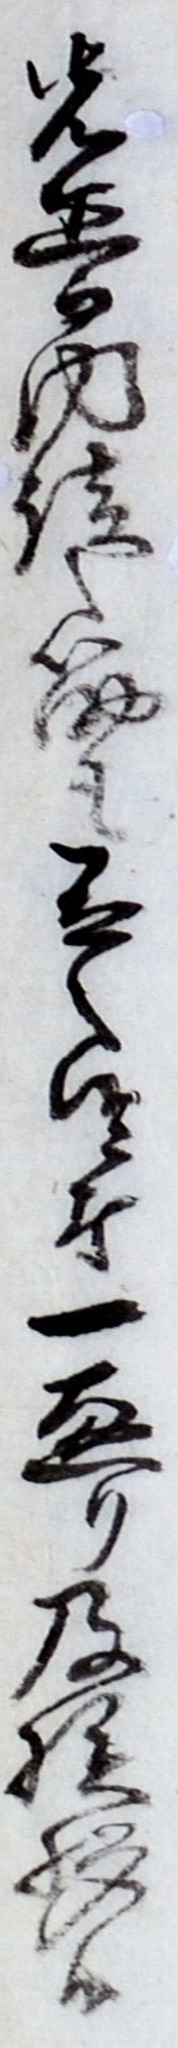先達而内談之筋も有之候ニ付一通り及挨拶候
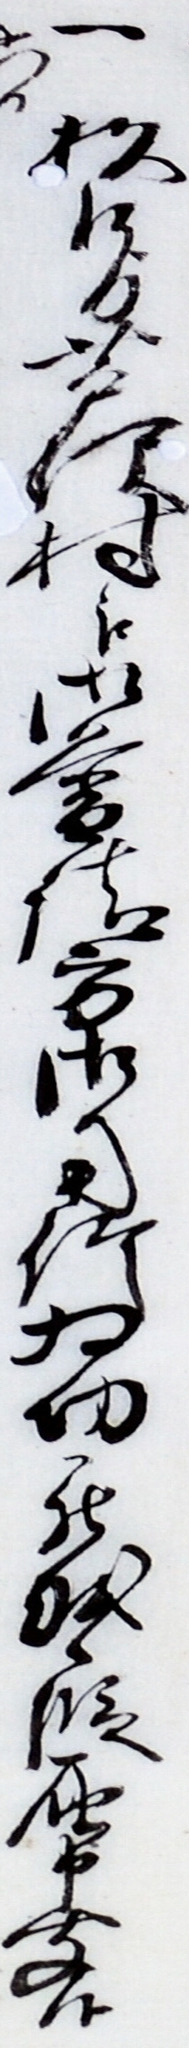一杉左衛門芦沢村江御普請方御用竹為切罷越候段届申聞候
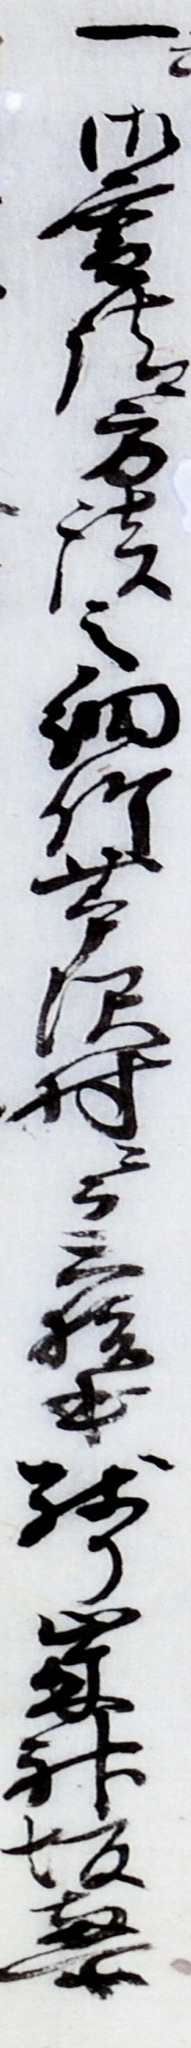一御普請方談之細竹芦沢村ニ而三拾本残り歳神坂両所
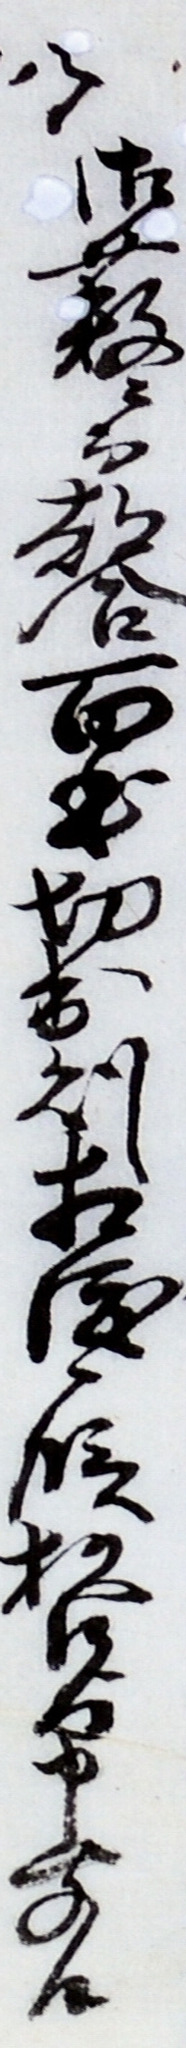御藪ニ而都合百本切出則相渡候段杉左衛門申聞候
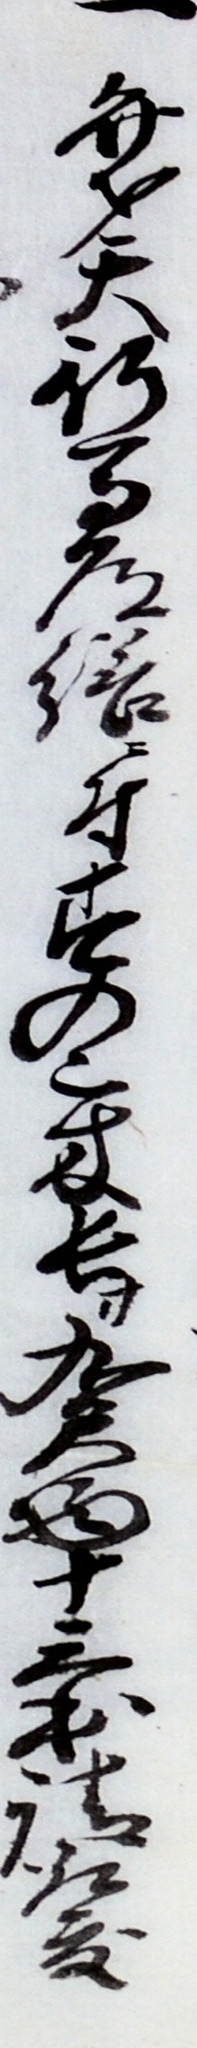一弁才天行馬道繕ニ付すのこ木長サ九尺物十三本請取度
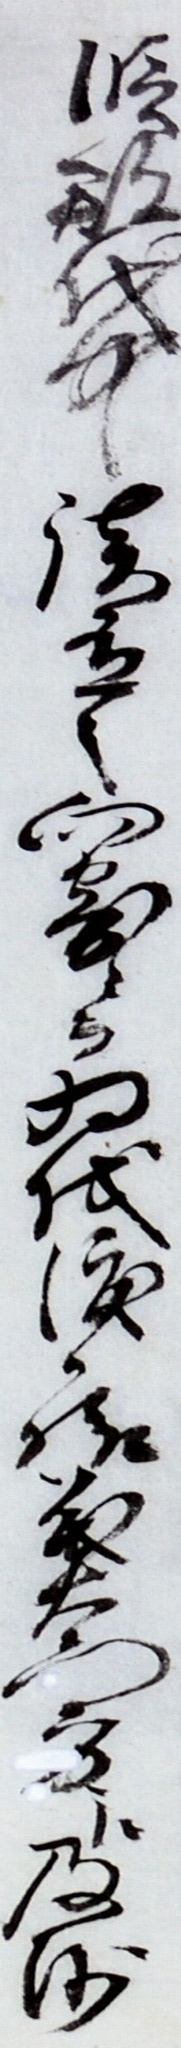段郡代中談有之向寄ニ而為伐渡候様義右衛門方江及沙
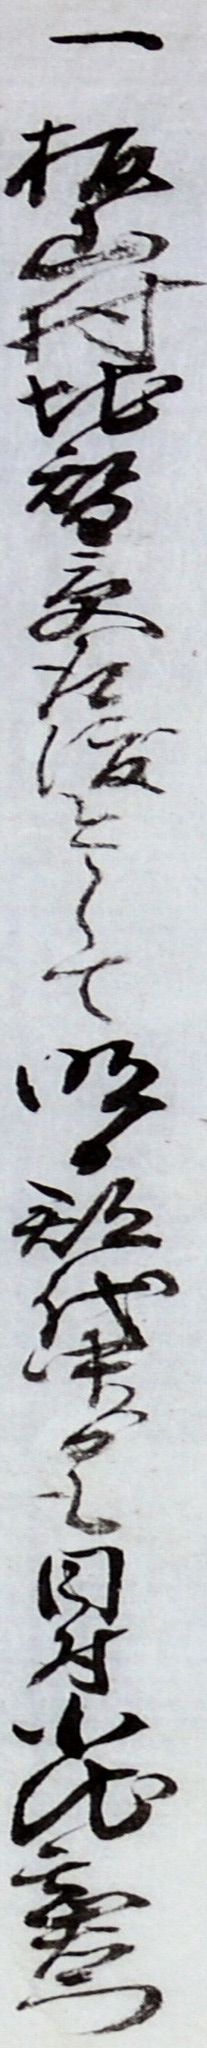一板山村地替受取渡として明日郡代中ゟも目付小池甚右衛門
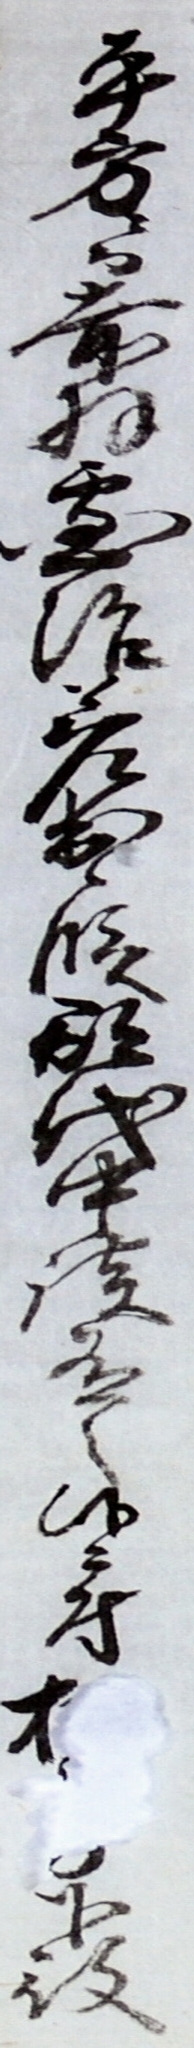平方ニ而赤羽団治差出候段郡代中談有之候ニ付下役
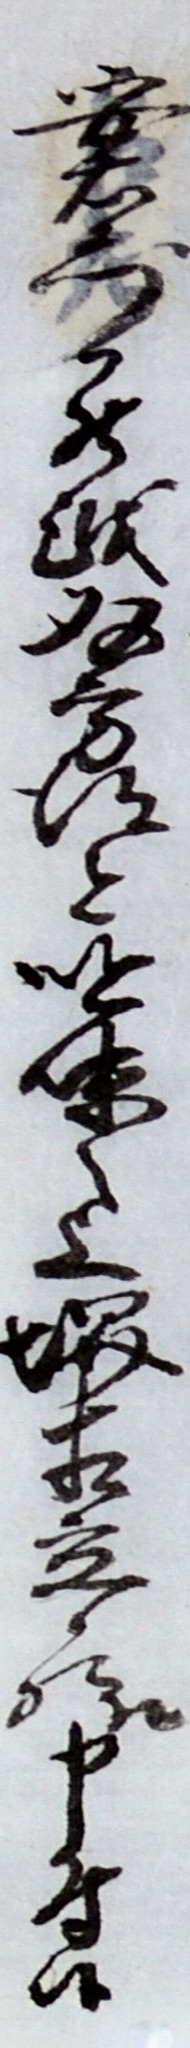安右衛門罷越双方得と吟味之上堺相立候様申付候
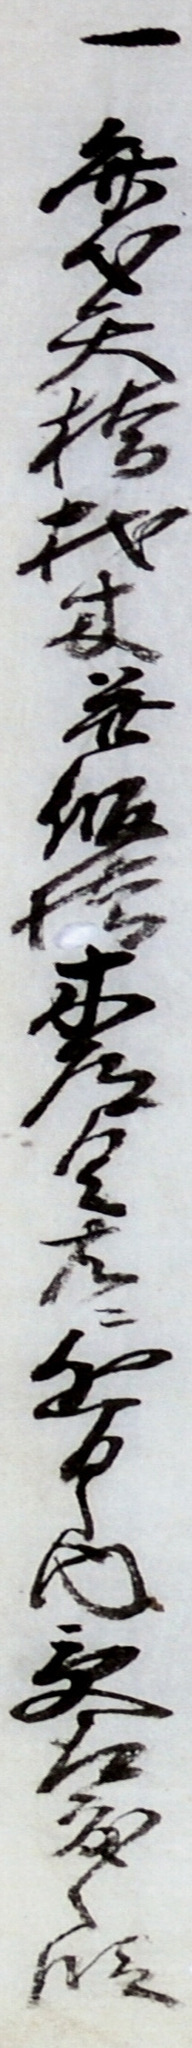一弁才天橋材木并仮橋木道具共ニ近日之内受取度候段

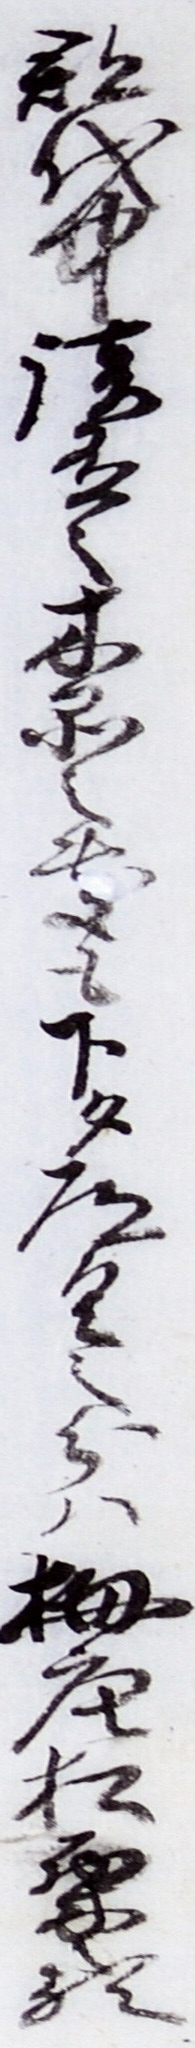郡代中談有之木品之処も下タ道具之分ハ栂唐松栗類
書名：御山奉行御用控
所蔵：伊那市立高遠町図書館・合同会社AMANE
